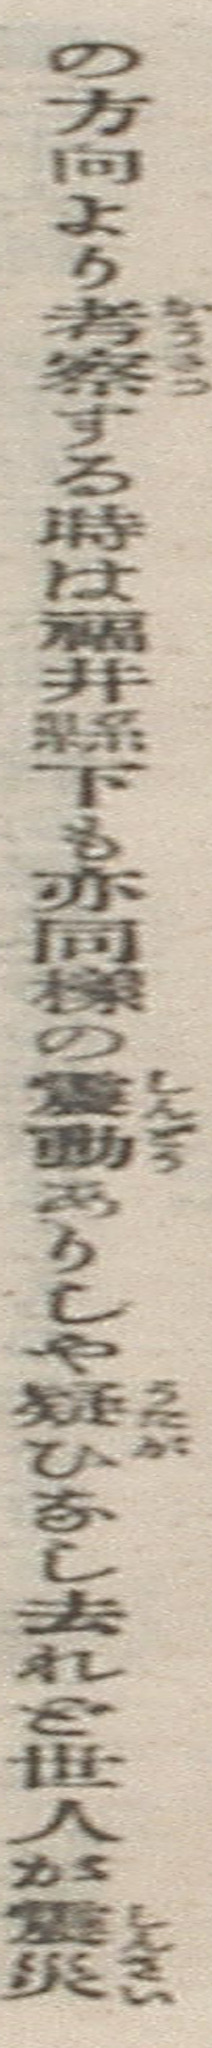の方向より考察する時は福井縣下も亦同様の震動ありしや疑ひなし去れど世人が震災
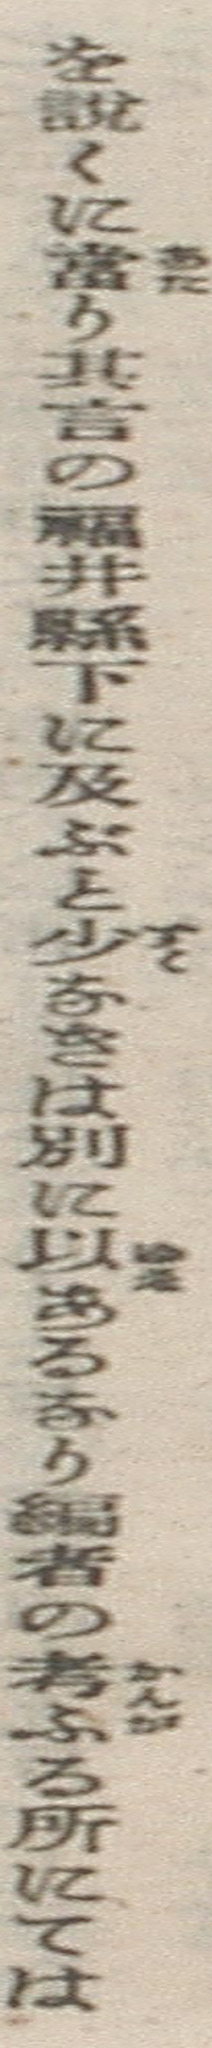を説くに當り其言の福井縣下に及ぶこと少なきは別に以あるなり編者の考ふる所にては
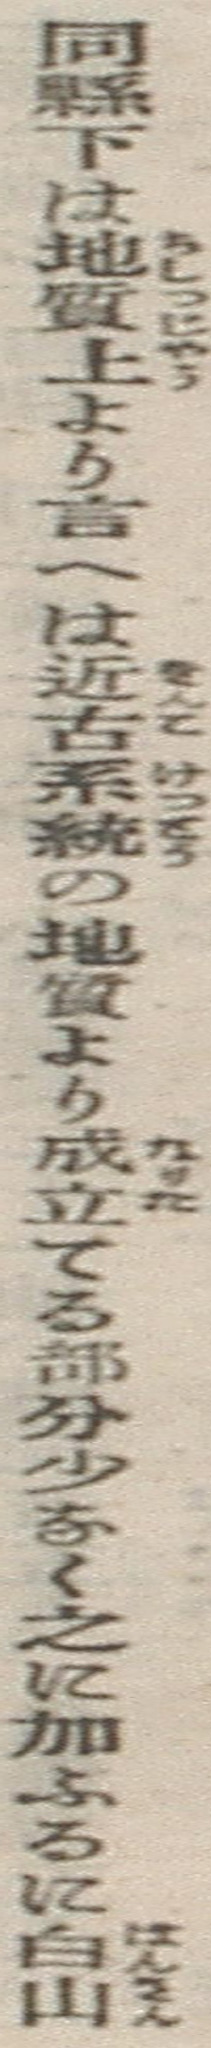同縣下は地質上より言へは近古系統の地質より成立てる部分少なく之に加ふるに白山
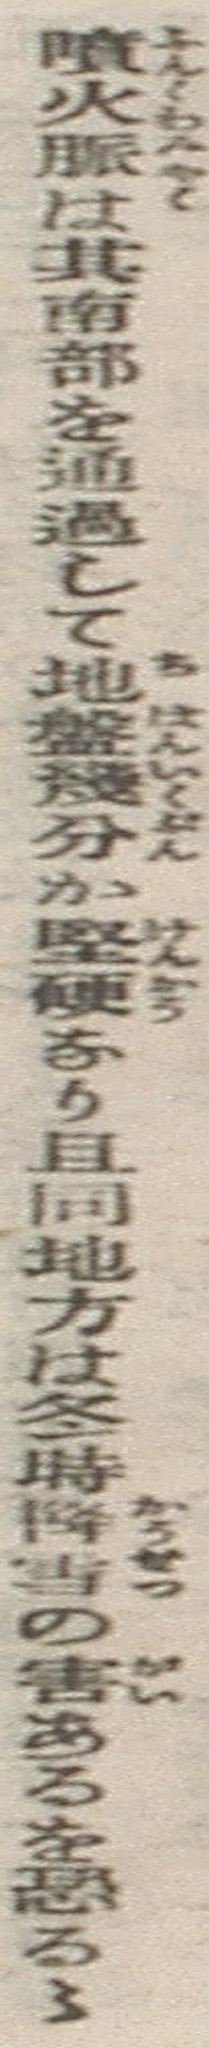噴火脈は其南部を通過して地盤幾分か堅硬なり且同地方は冬時降雪の害あるを恐るゝ
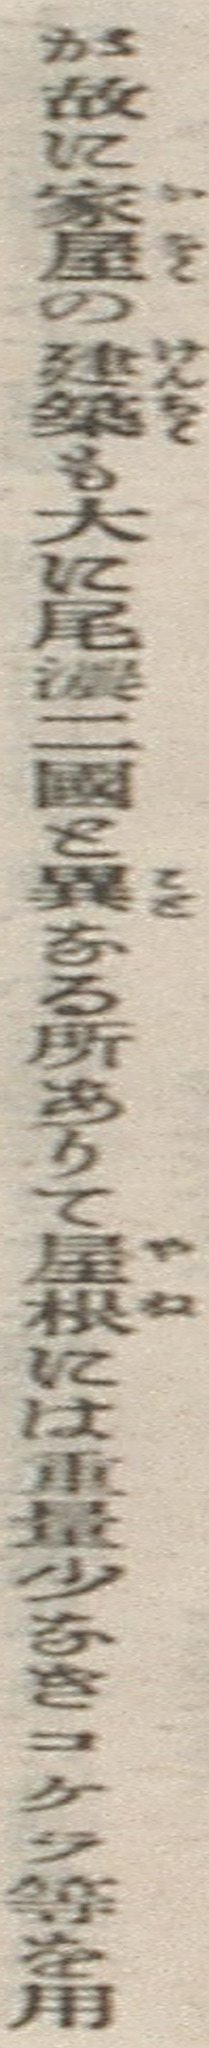が故に家屋の建築も大に尾濃二國と異なる所ありて屋根には重量少なきコケラ等を用
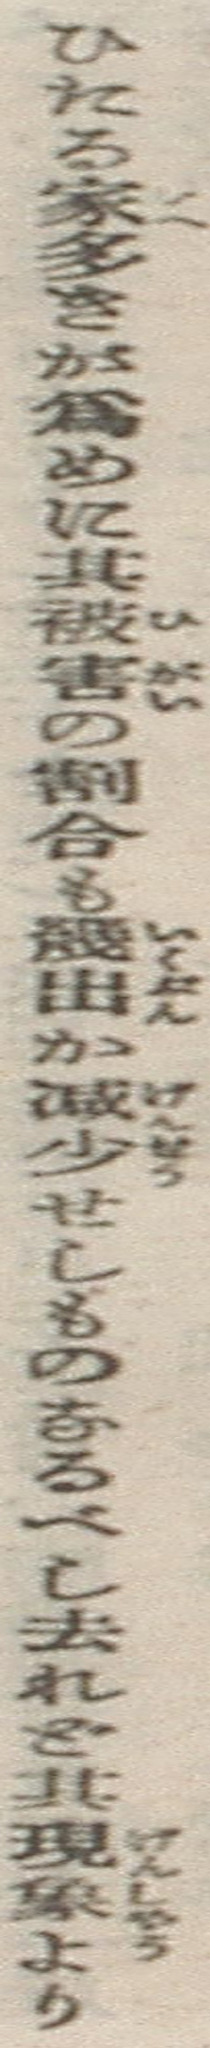ひたる家多きが為めに其被害の割合も幾出か減少せしものなるべし去れども其現象より
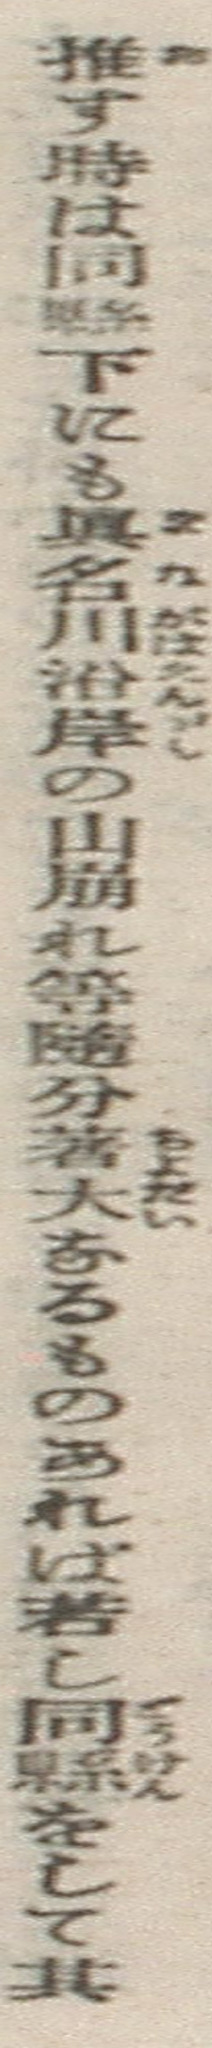推す時は同縣下にも真名川沿岸の山崩れ等随分著大なるものあれば若し同縣をして其の
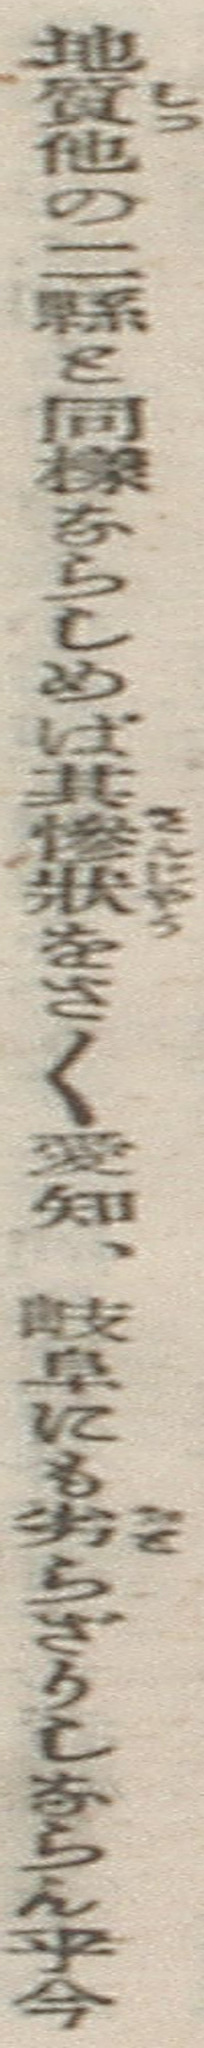地質他の二縣と同様ならしめば其惨状をさ〳〵愛知、岐阜にも劣らざりしならん乎今
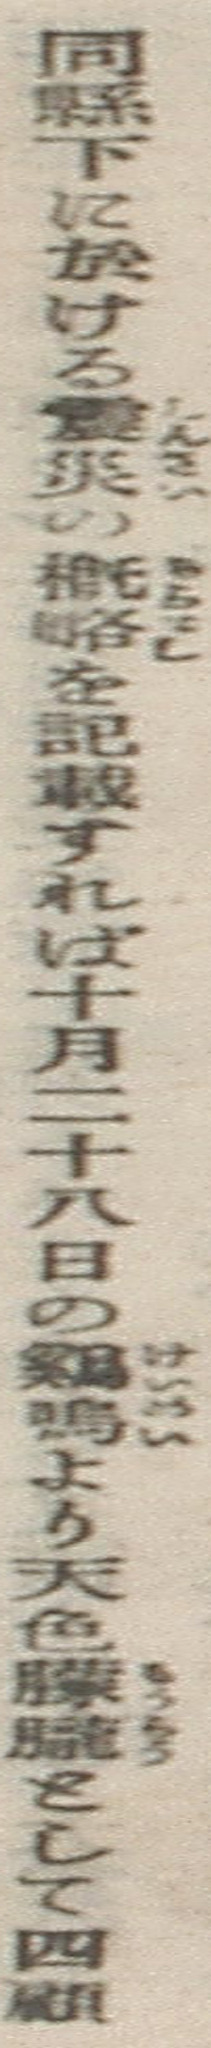同縣下に於ける震災の概略を記載すれば十月二十八日の鶏鳴より天色朦朧として四顧
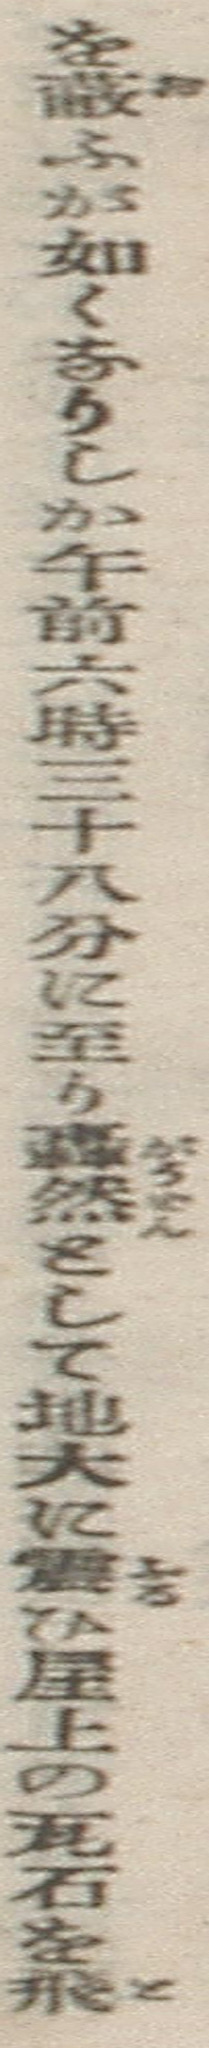を蔽ふが如くなりしか午前六時三十八分に至り轟然として地大に震ひ屋上の瓦石を飛
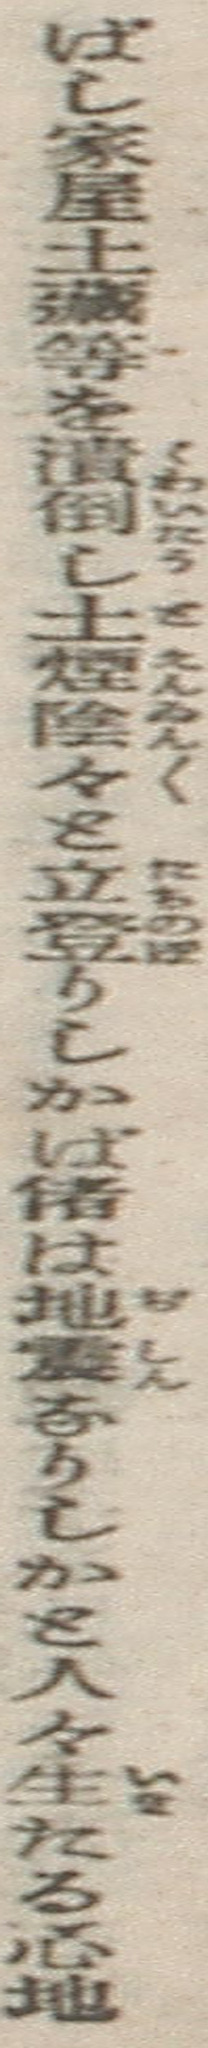ばし家屋土蔵等を潰倒し土煙陰々と立登りしかば偖は地震なりしかと人々生たる心地

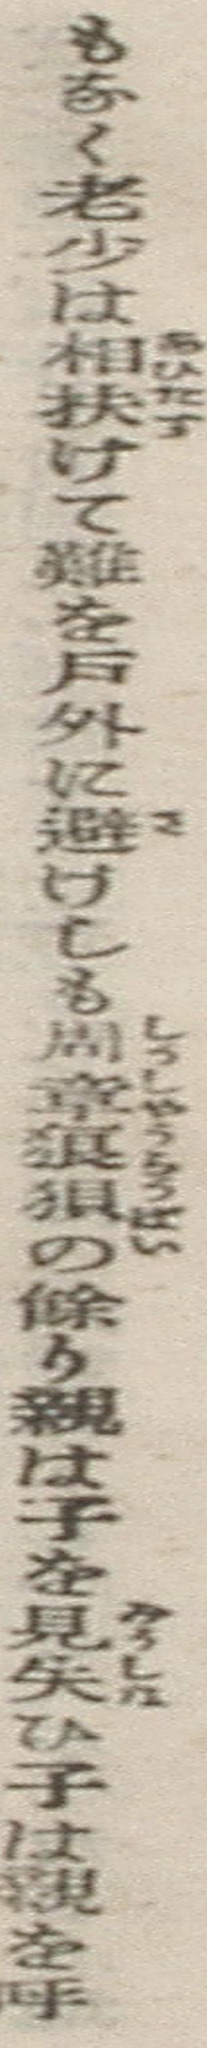もなく老少は相扶けて難を戸外に避けしも周章狼狽の餘り親は子を見失ひ子は親を呼
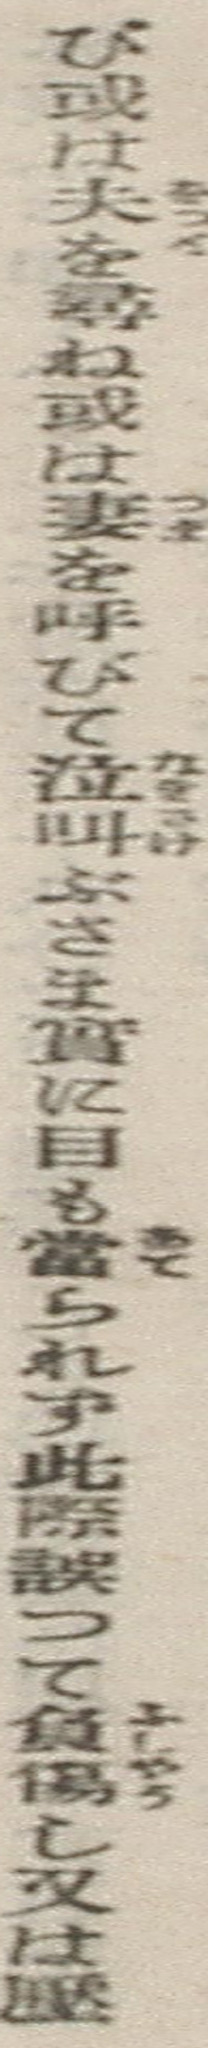び或は夫を尋ね或は妻を呼びて泣叫ぶさま實に目も当られず此際誤つて負傷し又は厭
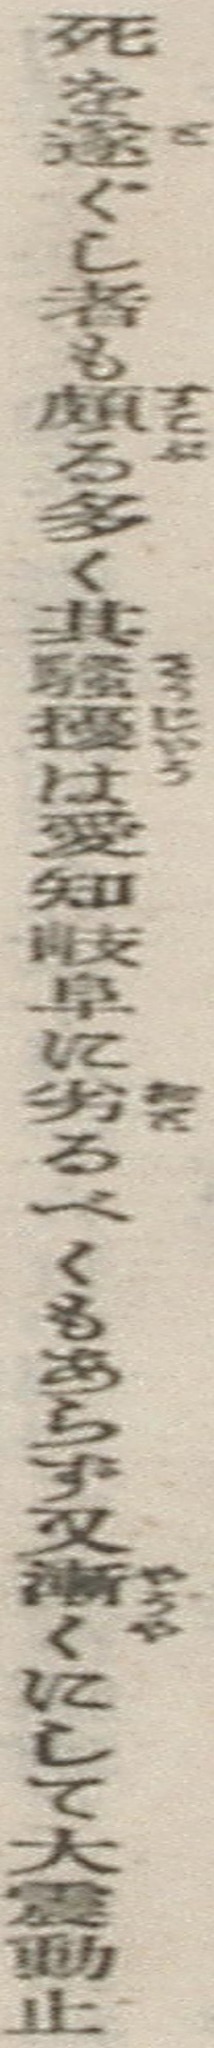死を遂ぐし者も頗る多く其騒擾は愛知岐阜に劣るべくもあらず又漸くにして大震動止
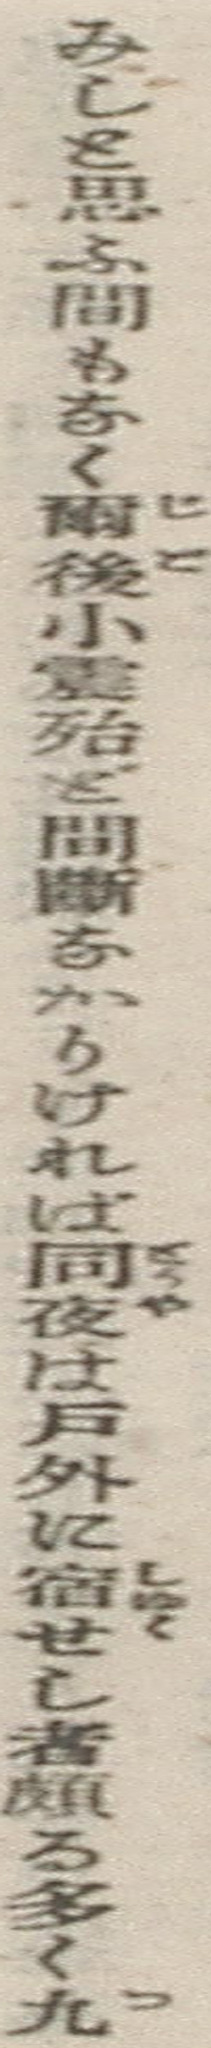みしと思ふ間もなく爾後小震殆ど間断なかりければ同夜は戸外に宿せし者頗る多く九
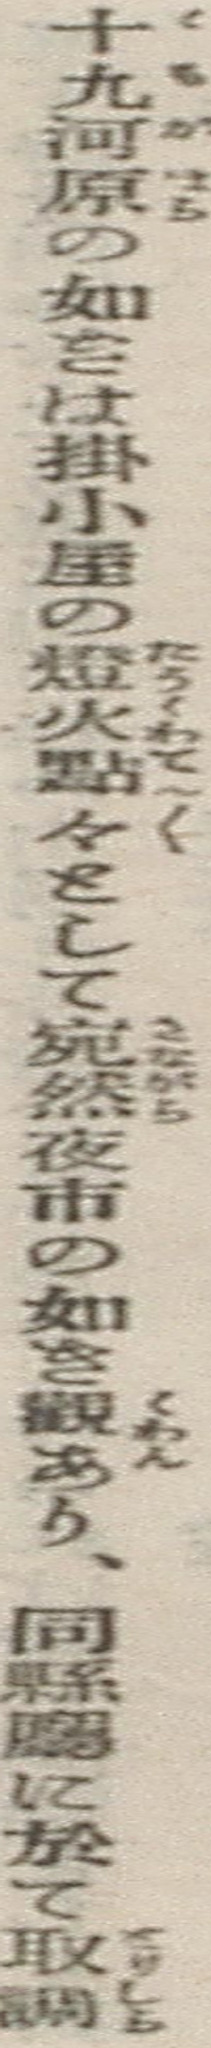十九河原の如きは掛小屋の燈火點々として宛然夜市の如き観あり、同縣廰に於て取調
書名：愛知岐阜福井三県　大地震見聞録（内題）
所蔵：東京大学地震研究所図書室 Earthquake Research Institute Library, The University of Tokyo, JAPAN
